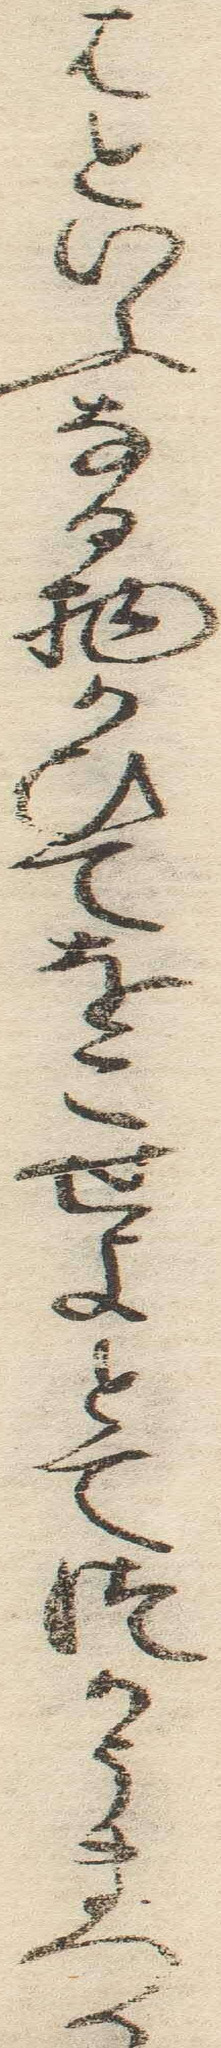はといふなる物かひてをこせよとてつかうまつる
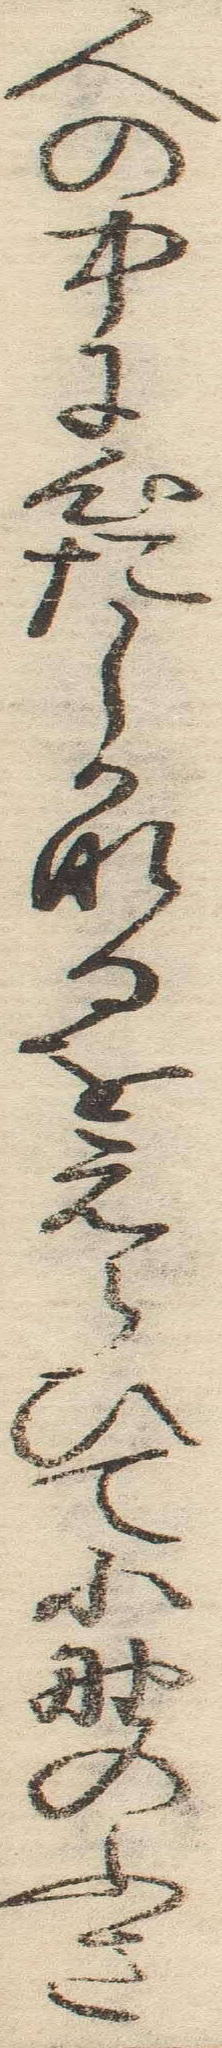人の中に心たしかなるをえらひて小屋のふさ

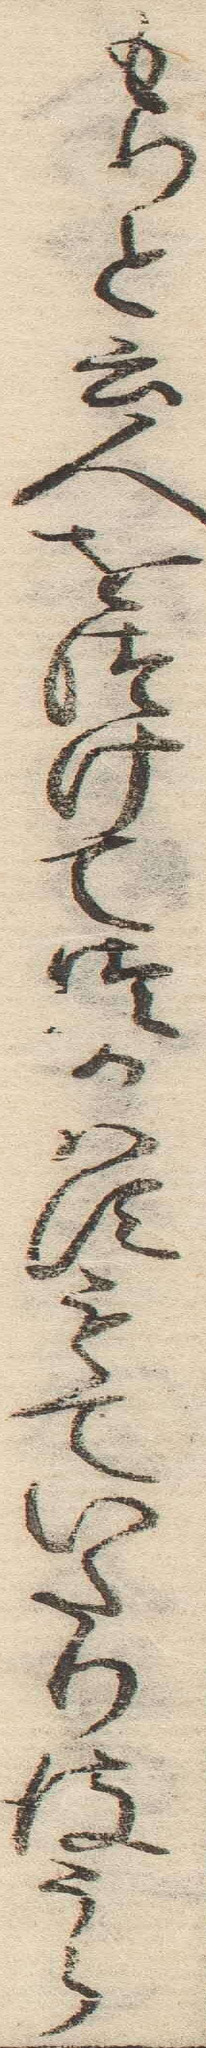もりと云人をつけてつかはすもていたり彼うら
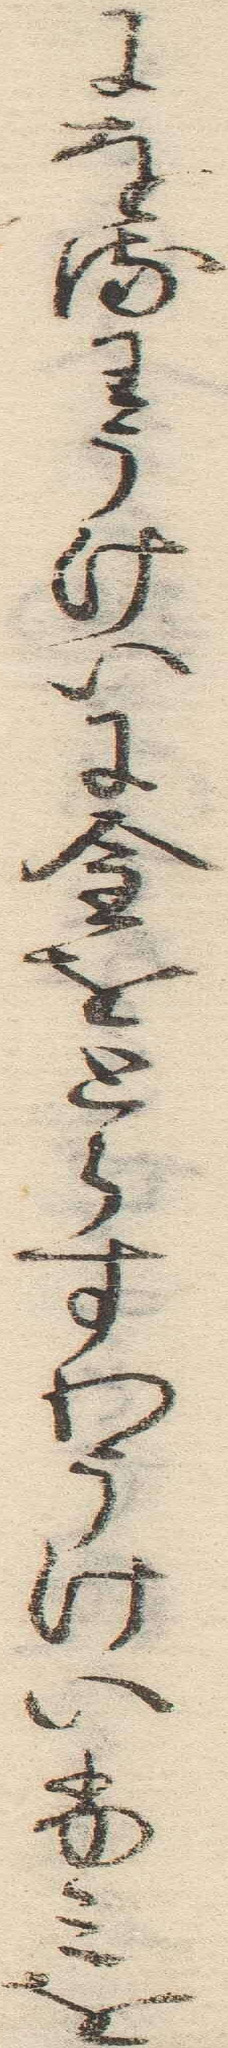にをるわうけいに金をとらすわうけいふみを
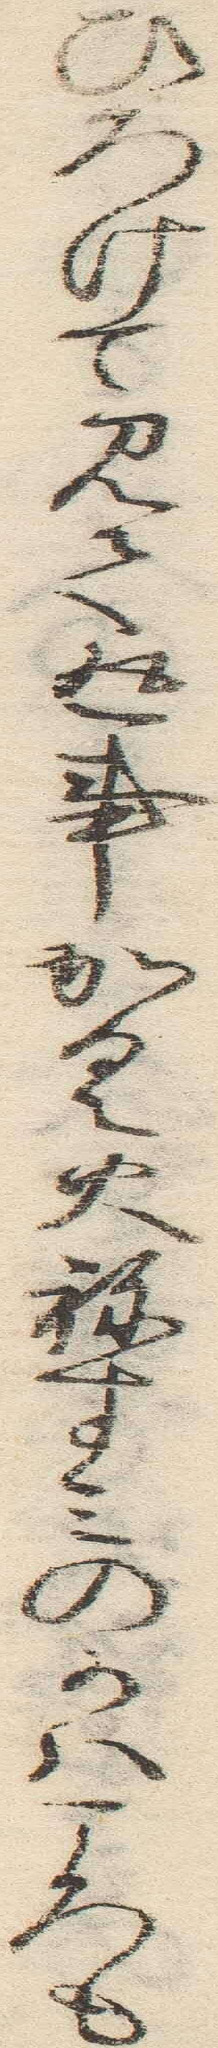ひろけて見て返事かく火ねすみのかはころも
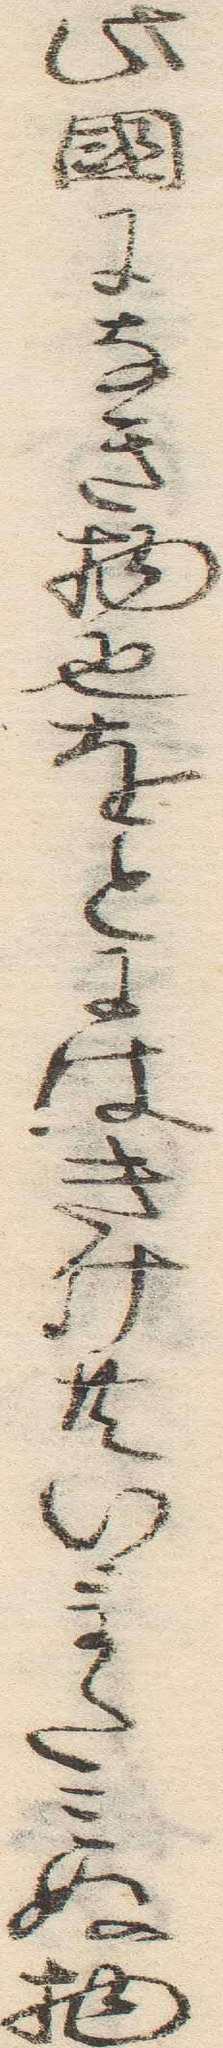此国になき物也をとにはきけ共いまたみぬ物
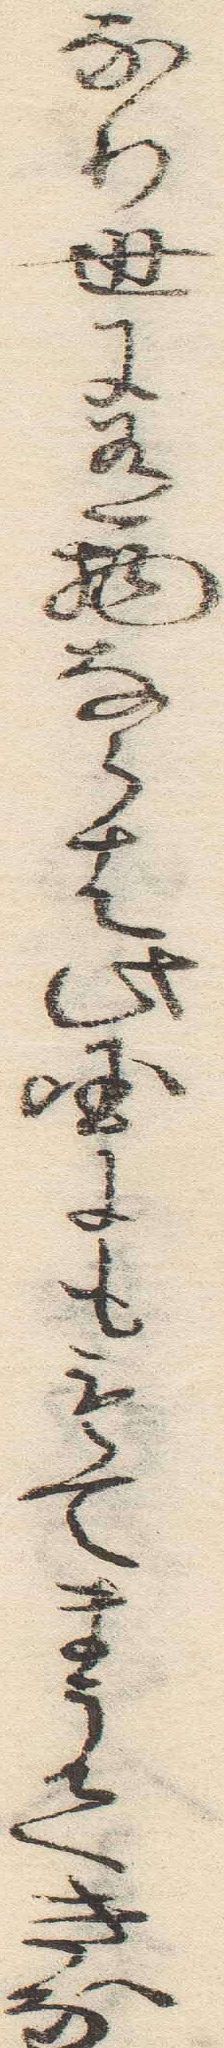なり世に有物ならは此国にももてまうてきな
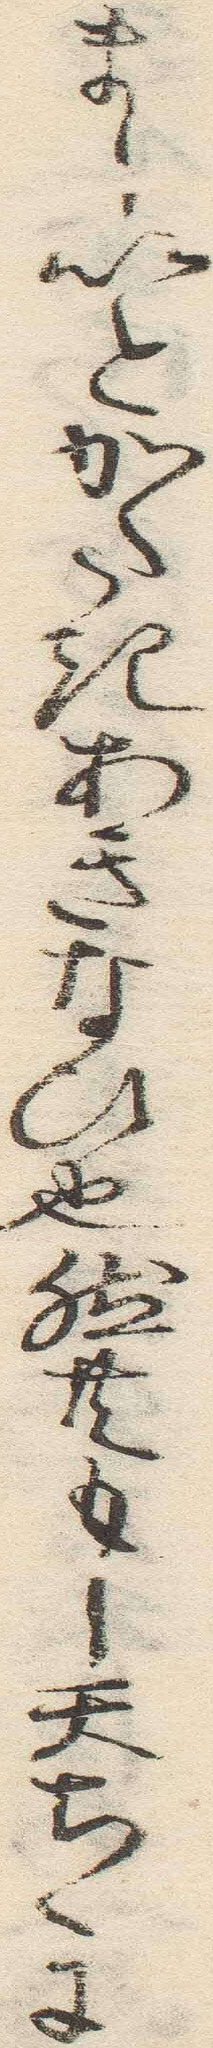ましいとかたきあきなひ也然共もし天ちくに
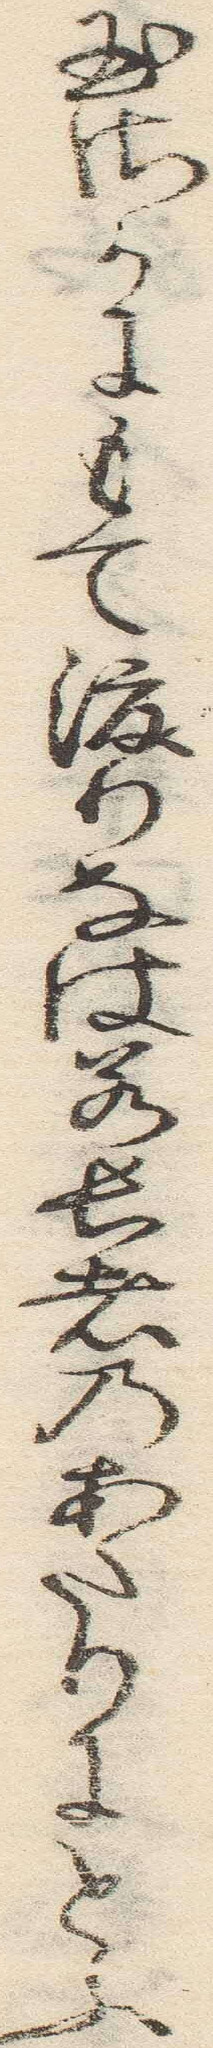玉さかにもて渡りなは若長者のあたりにとふ
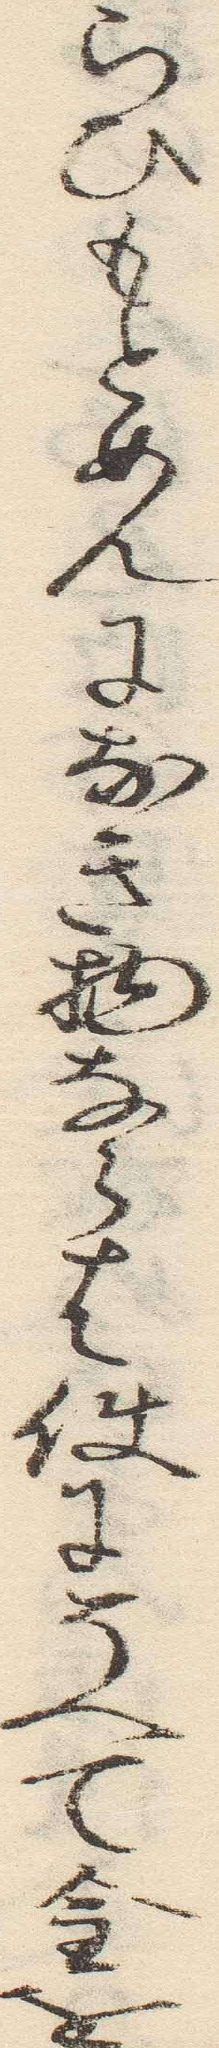らひもとめんになき物ならは使にそへて金を
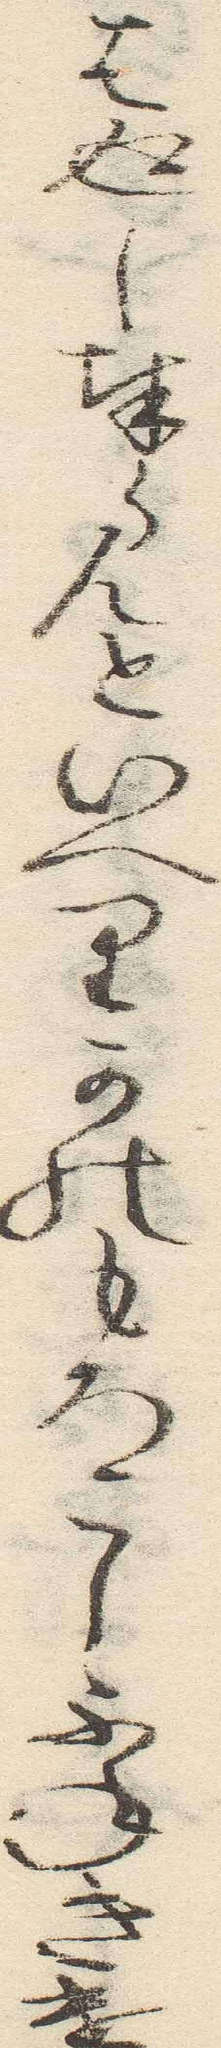は返し奉らんといへりかのもろこしふねきけ
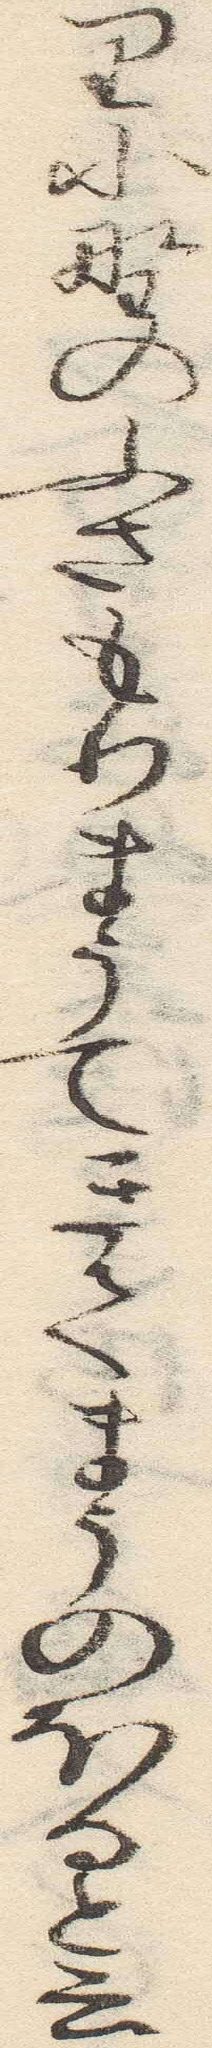り小屋のふさもりまうてきてまうのほると云
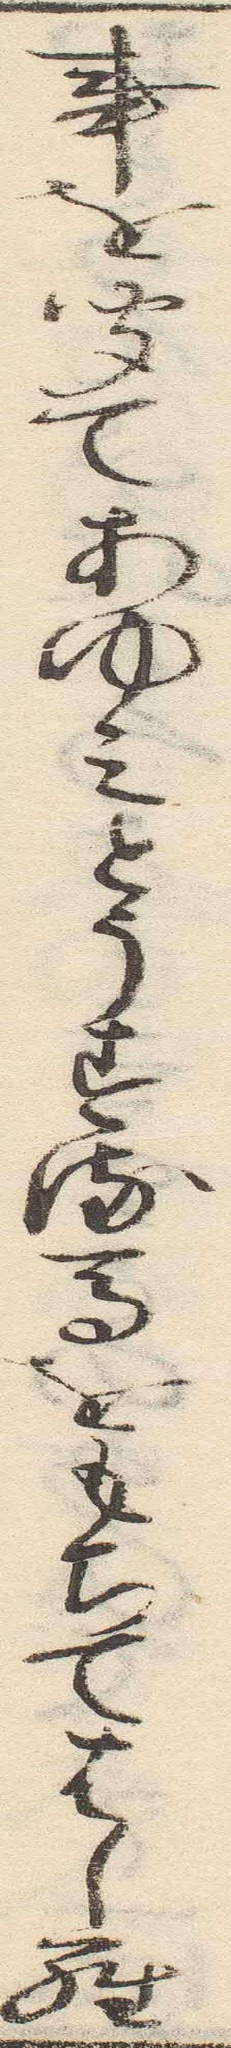事を聞てあゆみとうする馬をもちてはしら
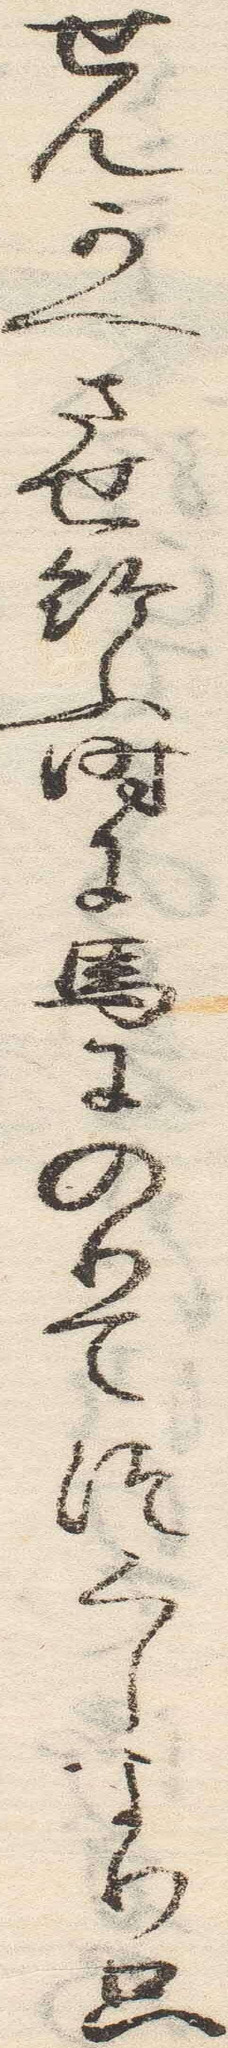せんかへさせ給ふ時に馬にのりてつくしより只
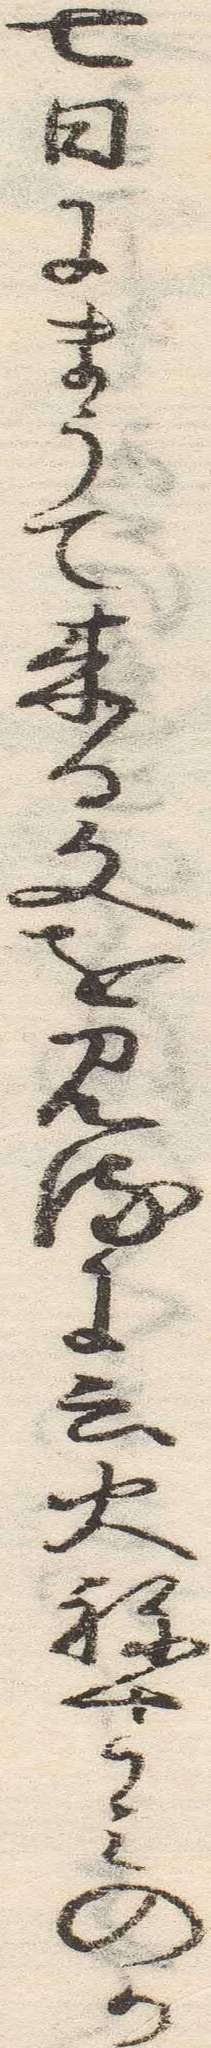七日にまうて来る文を見るに云火ねすみのか
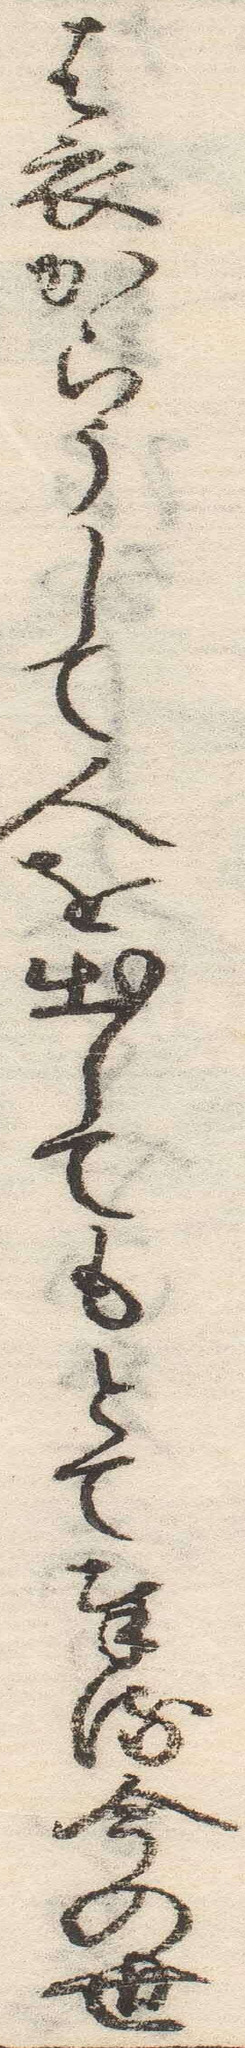は衣からうして人を出してもて奉る今の世
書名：竹取物語
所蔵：東京学芸大学附属図書館 国文学研究資料館
